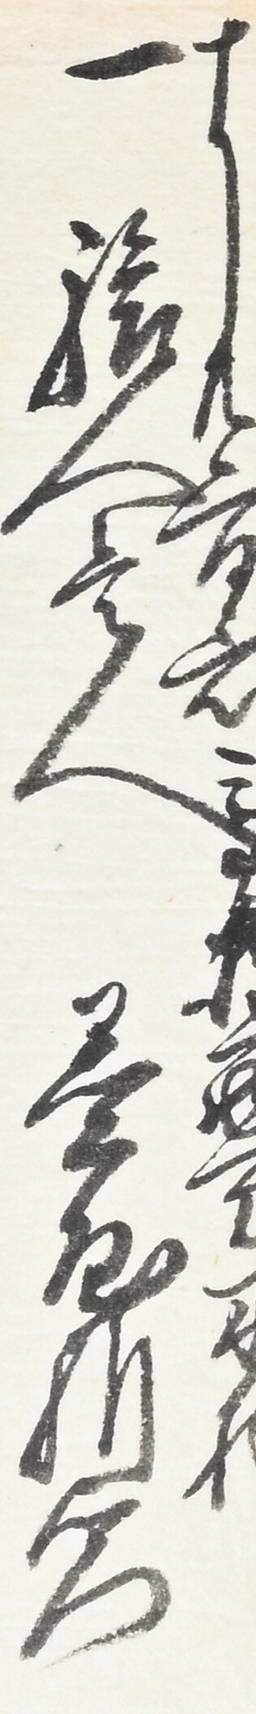一旅人壱人墨屋新右衛門
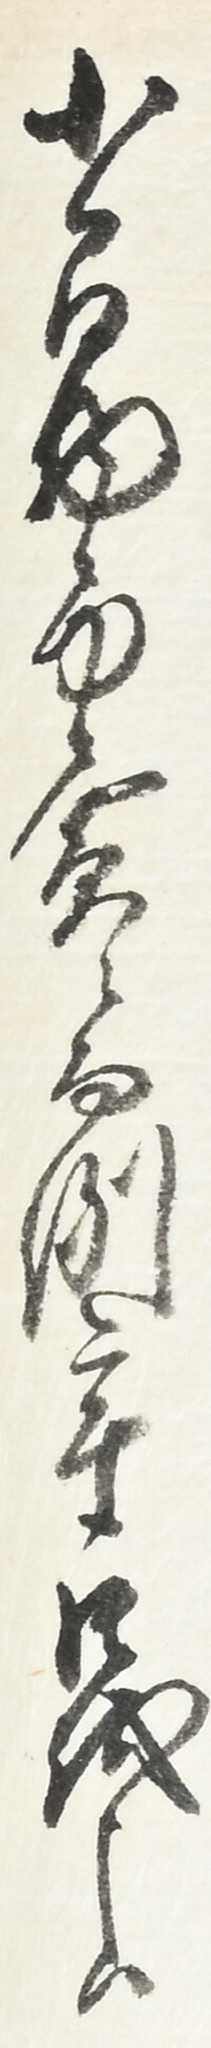小間物商売ニ而例年罷越申候
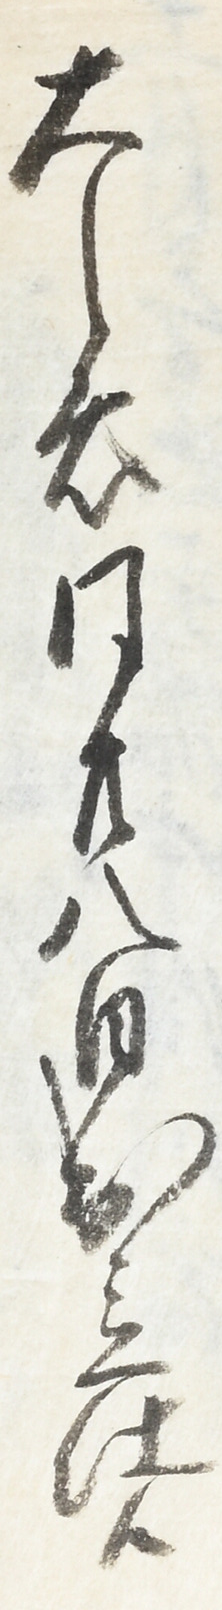右之者同廿七日出立仕候

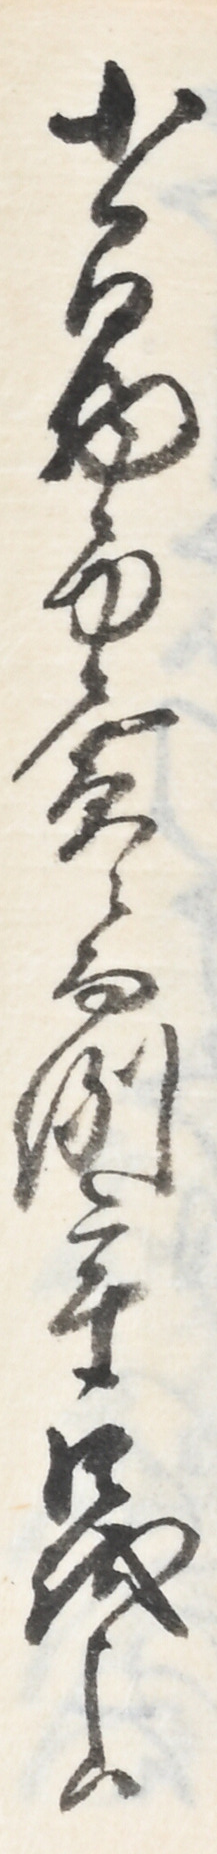小間物商売ニ而例年罷越申候
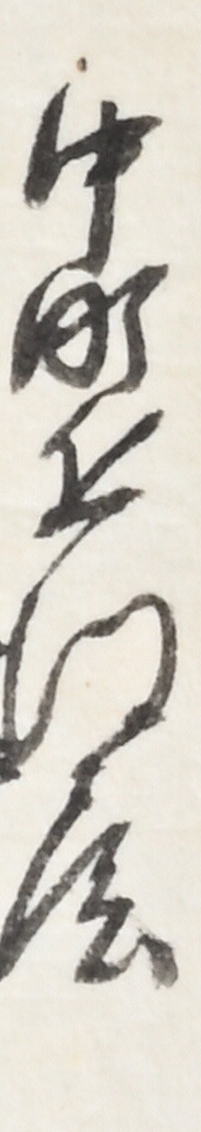中町近江屋
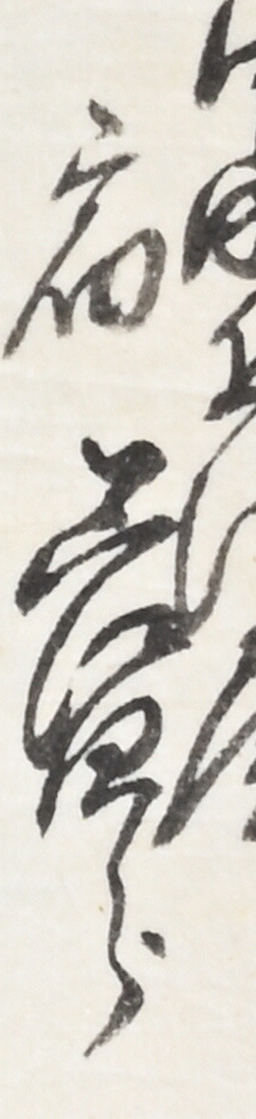宿善四郎
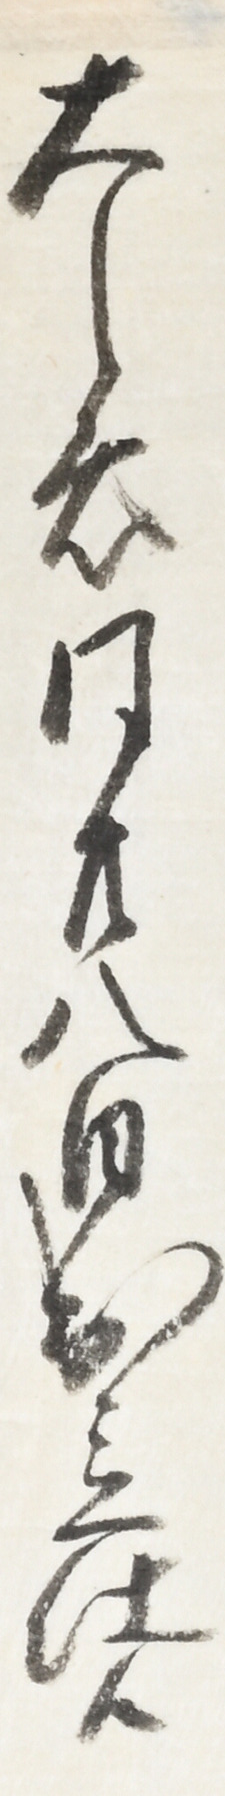右之者同廿八日出立仕候
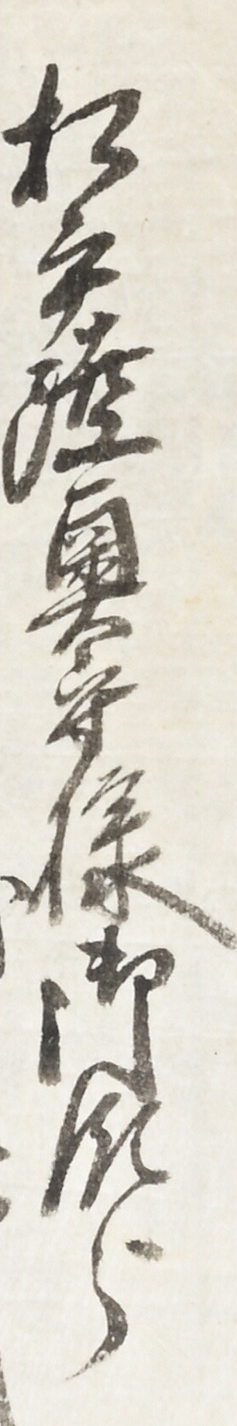松平陸奥守様御領分
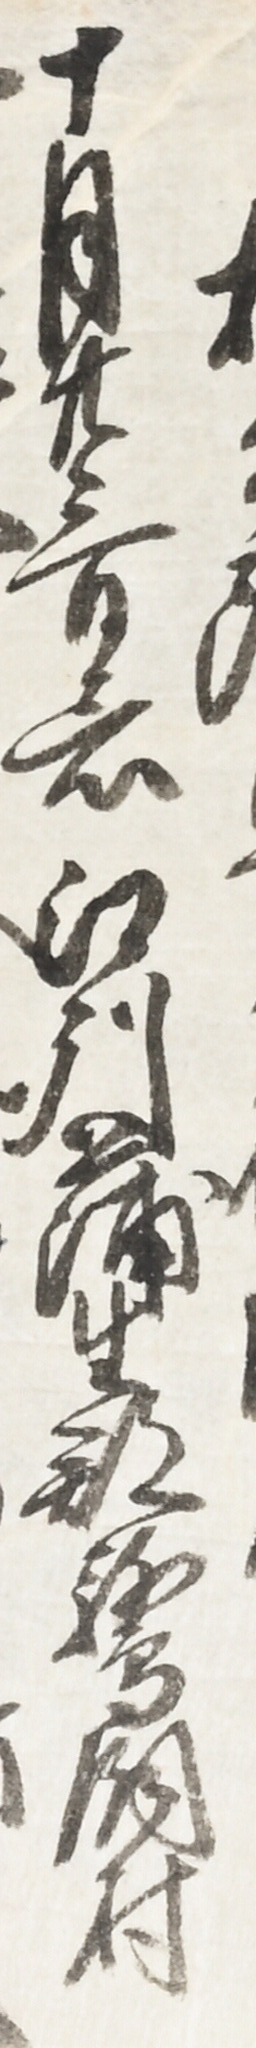十月廿三日着江州蒲生郡鷹飼村
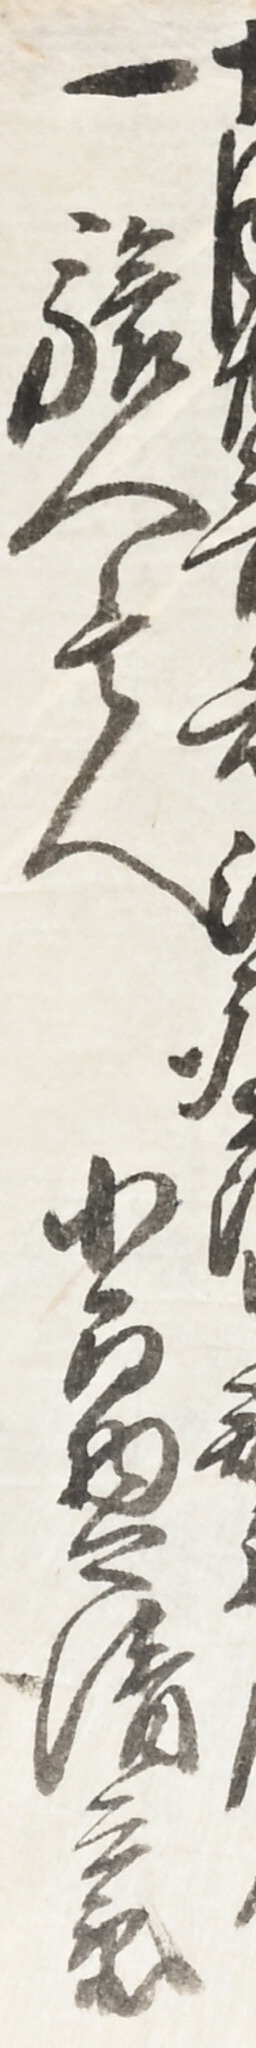一旅人壱人小間物や清兵衛
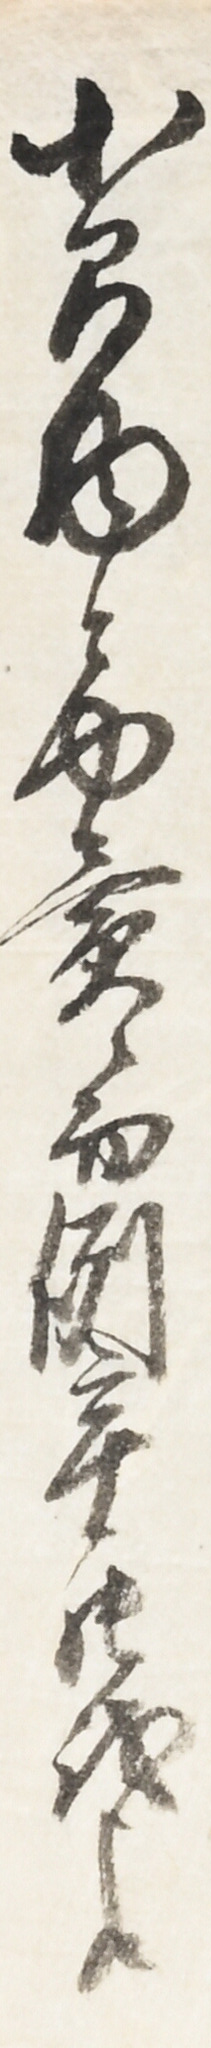小間物商売ニ而例年罷越申候
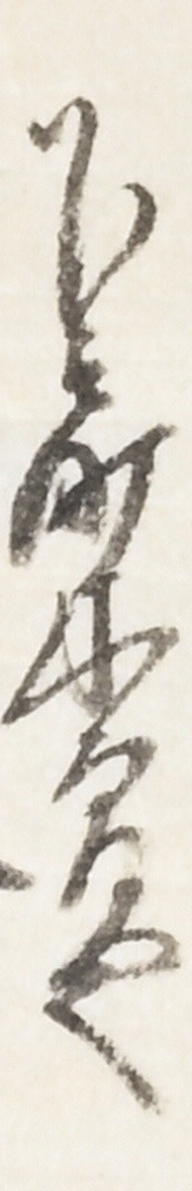下モ町木曽や
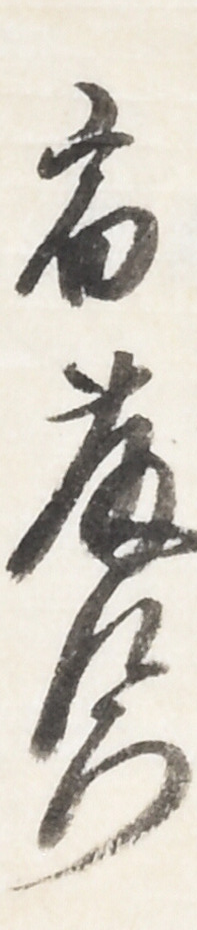宿籐左衛門
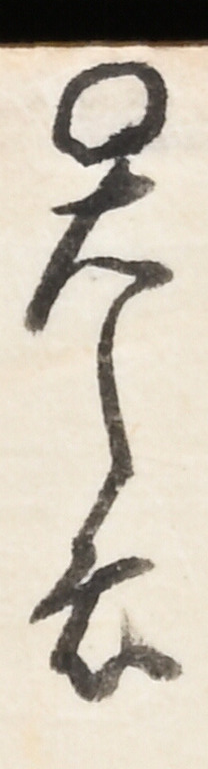〇右之者
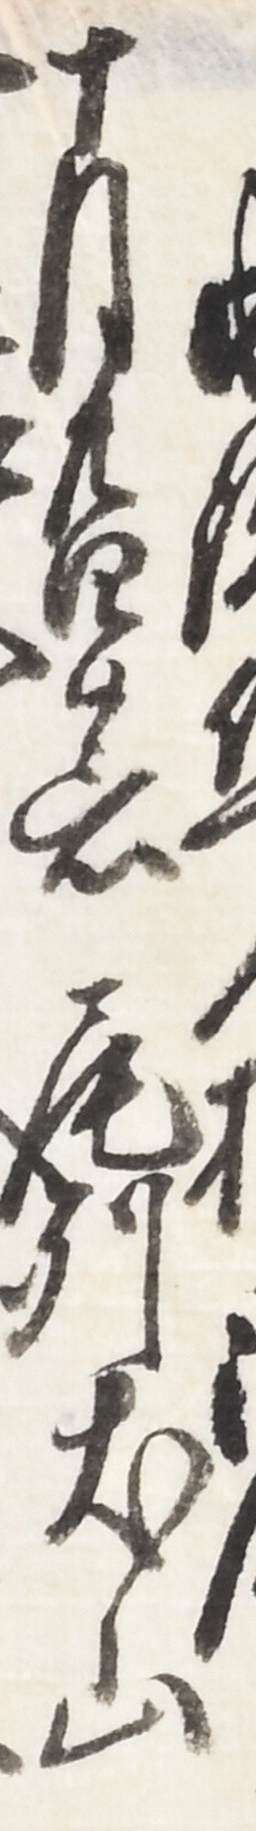十月廿四日着尾州犬山
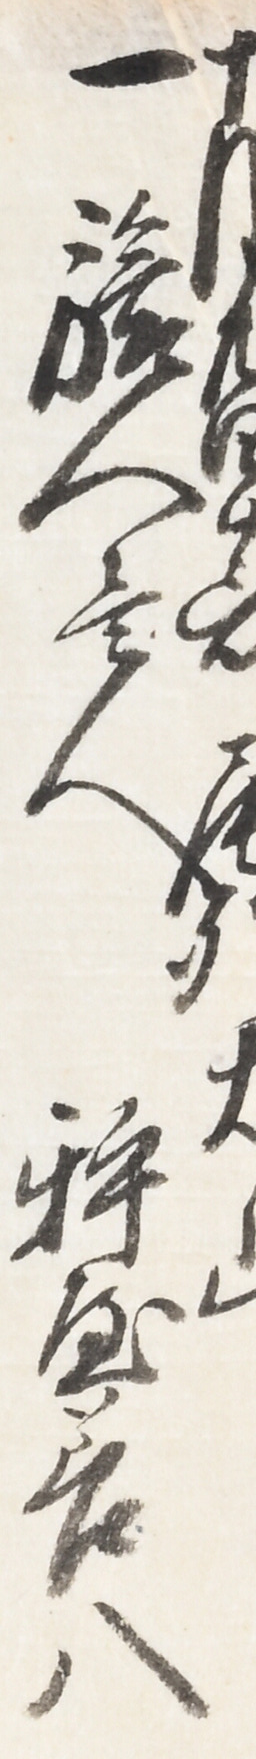一旅人壱人秤屋善八
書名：旅人泊控帳
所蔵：伊那市立高遠町図書館・合同会社AMANE
